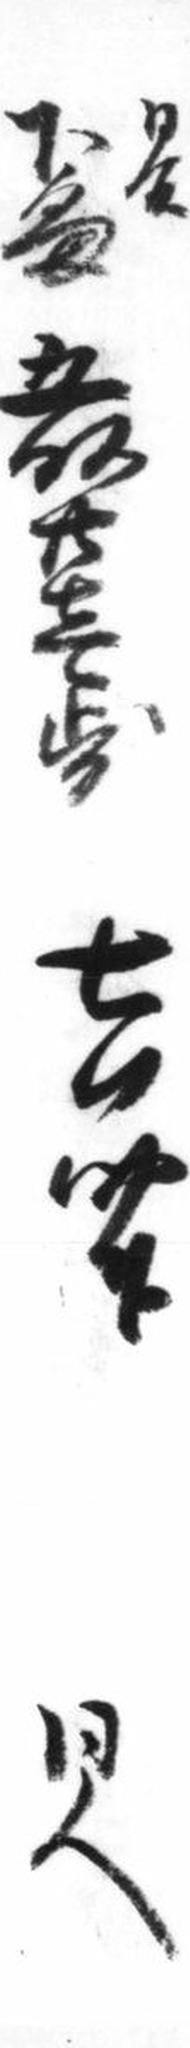下畠五畝廿壱歩七斗四升同人
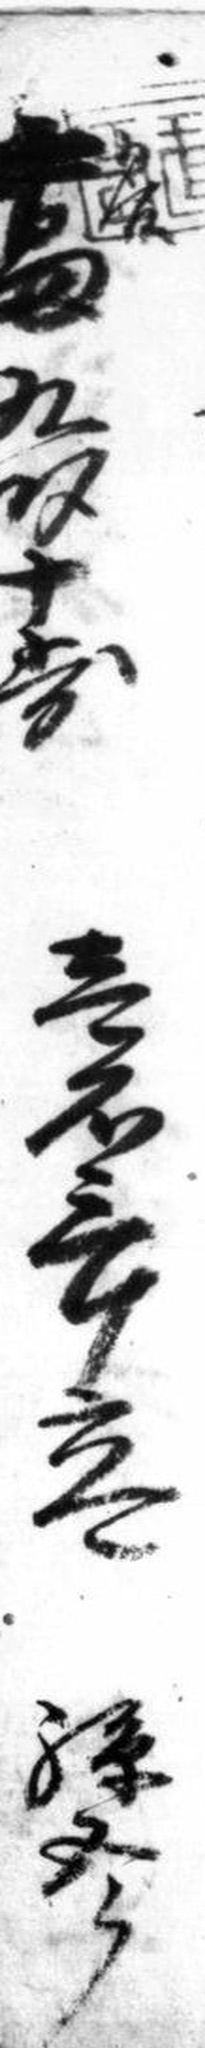中畠九畝十歩壱石三斗六合孫五郎

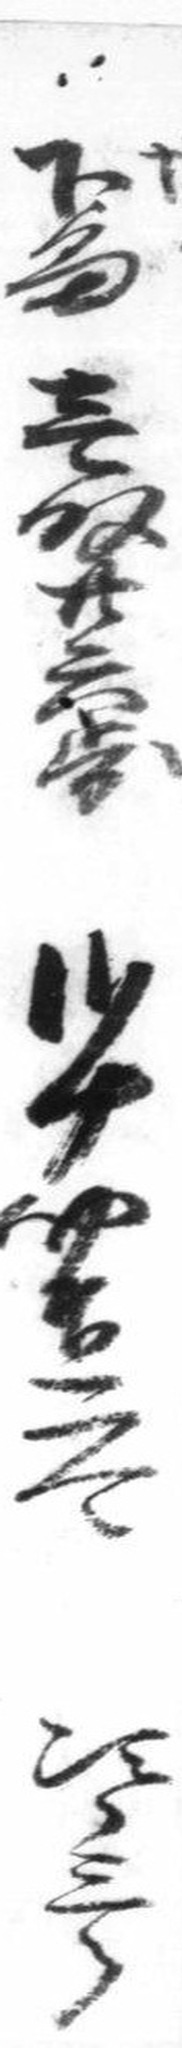下畠壱畝廿六歩弐斗四升二合次郎三郎
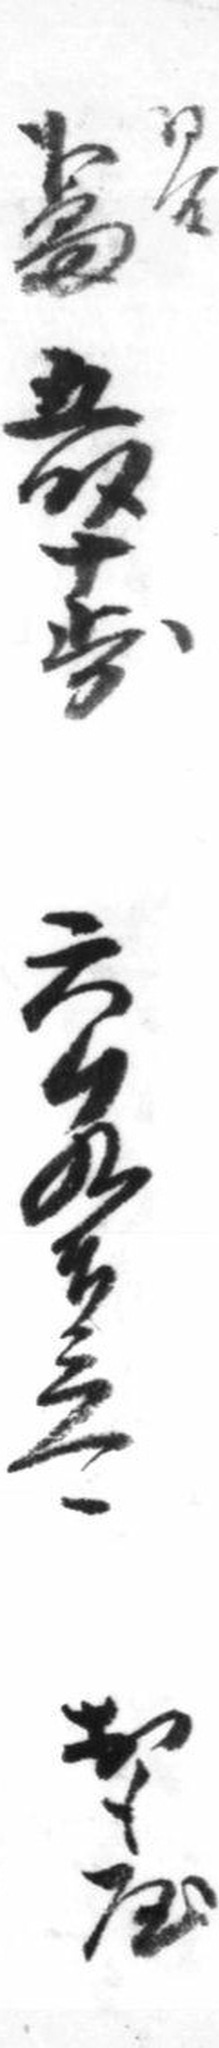下畠五畝十歩六斗九升三合出〆屋
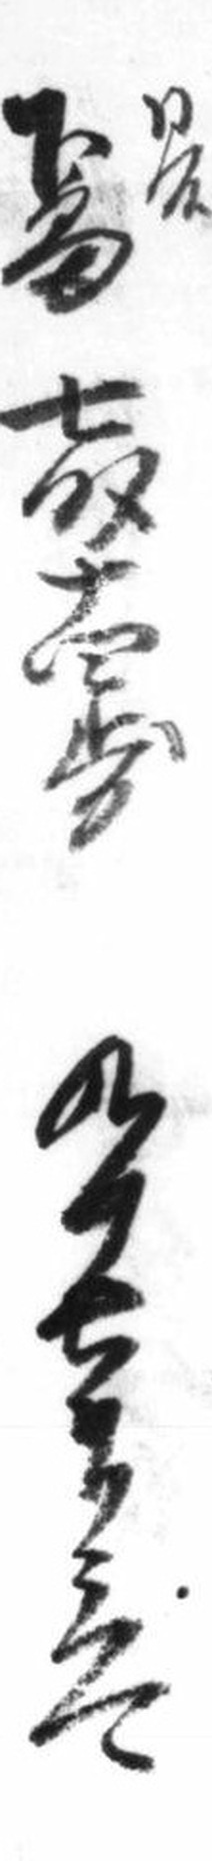下畠七畝十四歩九斗七升三合兵衛
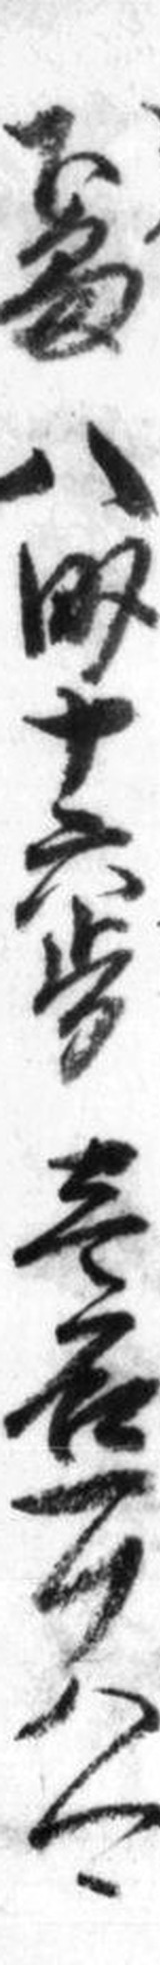下畠八畝十六歩壱石一斗八合道念

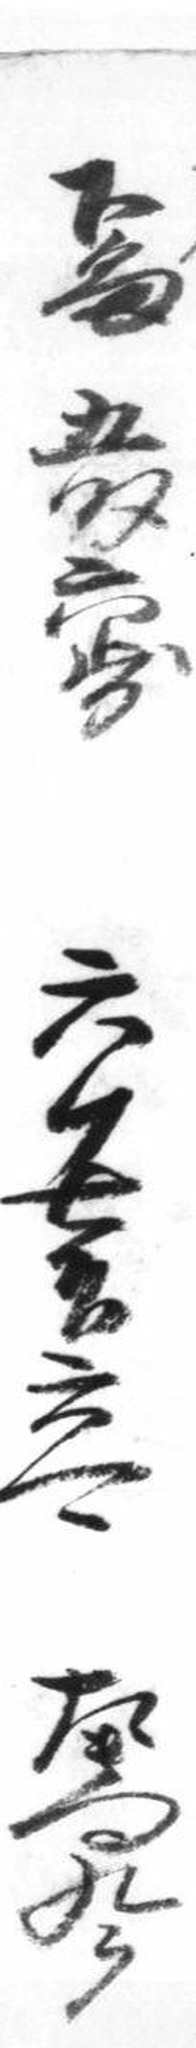下畠五畝六歩六斗七升六合左衛門九郎
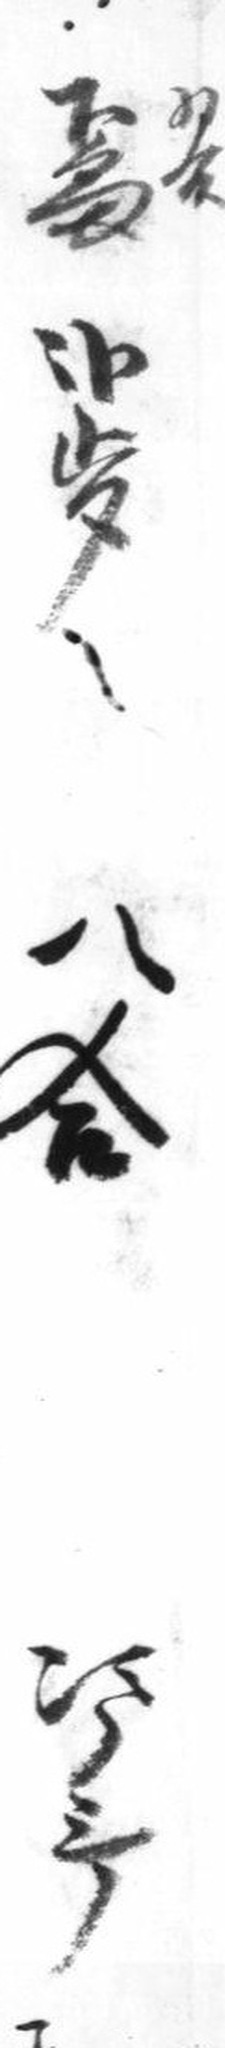下畠弐分八合次郎三郎
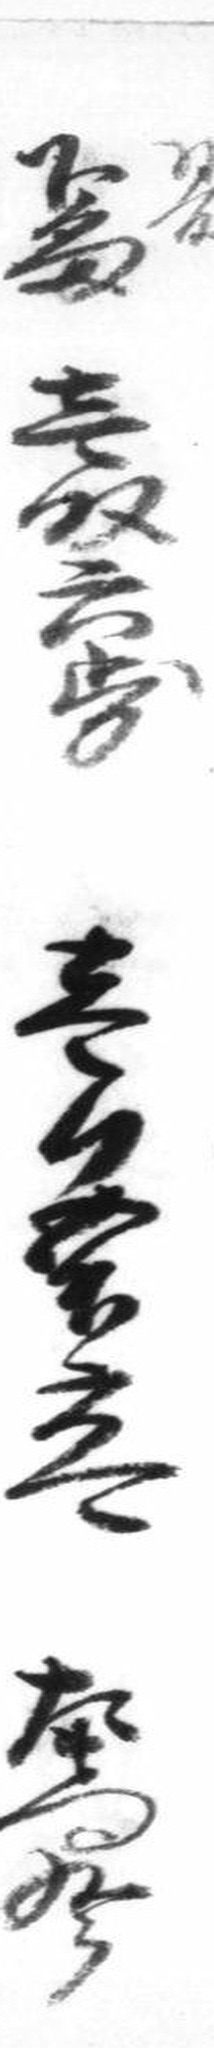下畠壱畝六歩壱斗五升六合左衛門九郎
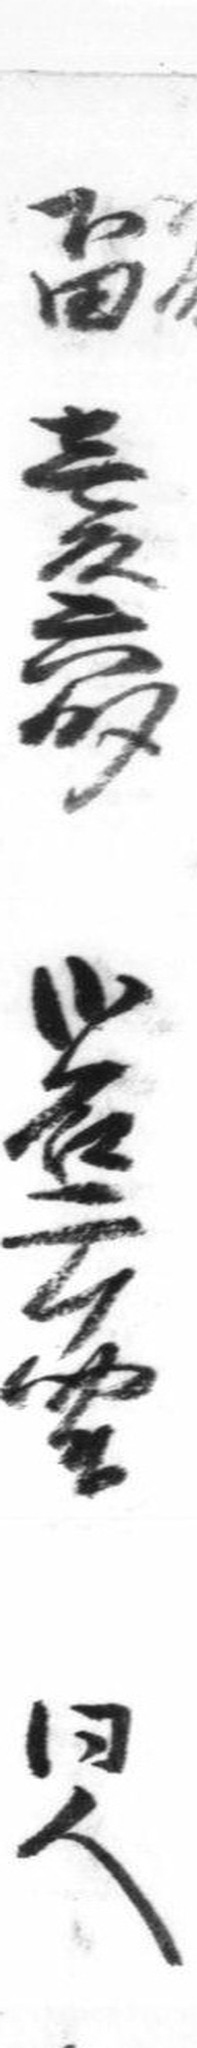下田壱反六畝弐石二斗四升同人
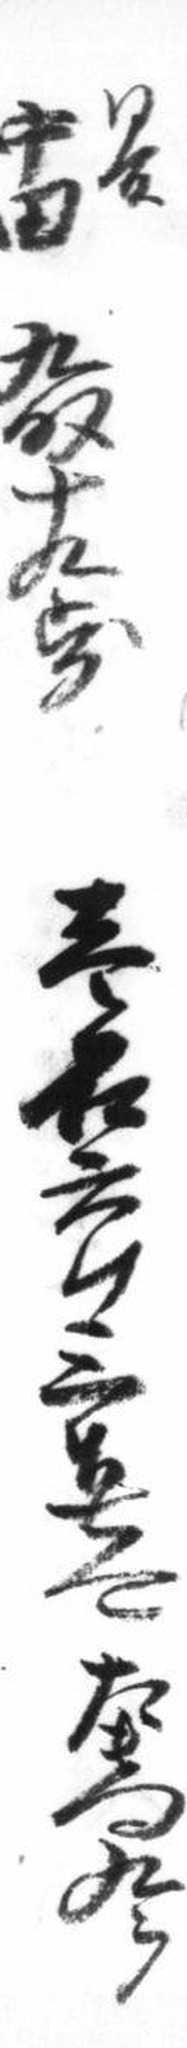中田九畝十九歩壱石六斗三升七合左衛門九郎
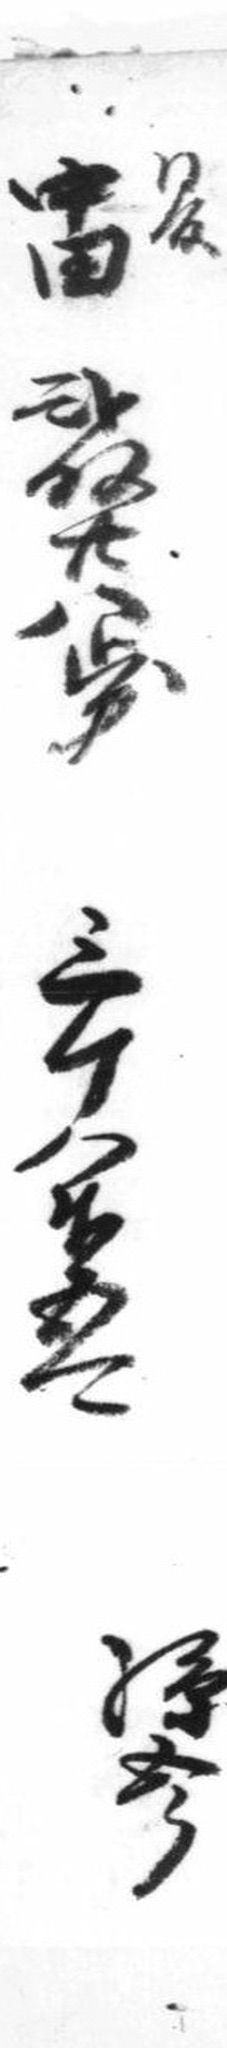中田弐畝廿八歩三斗八升五合孫五郎
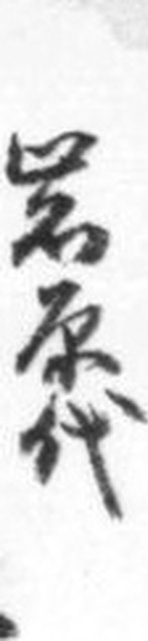岩原代
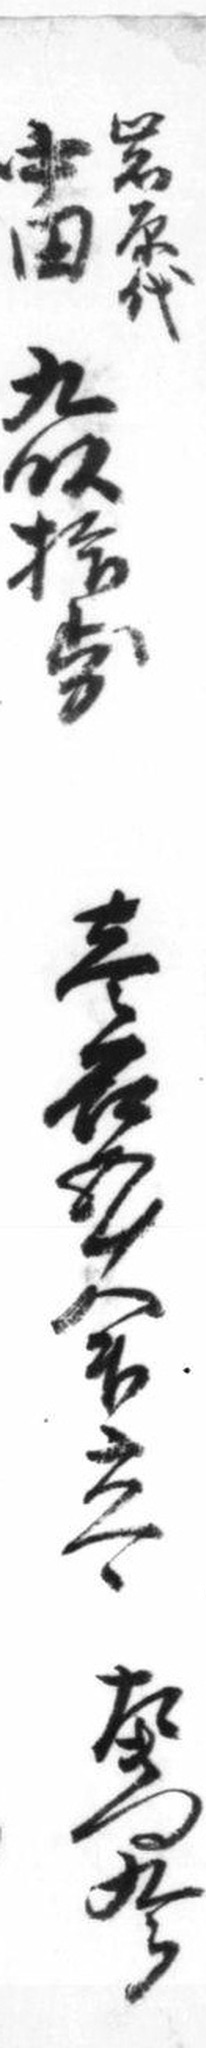中田九畝拾歩壱石五斗八升六合左衛門九郎
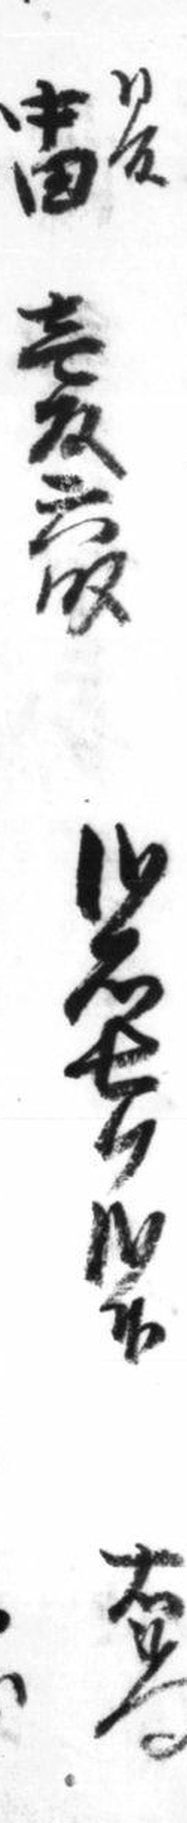中田壱反六畝弐石七斗弐升右衛門
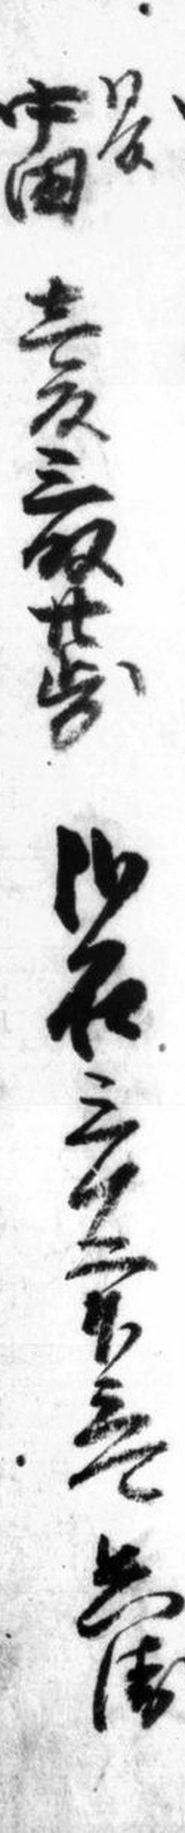中田壱反三畝廿歩弐石三斗二升三合兵衛
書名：越前国大野郡今井村御検地帳
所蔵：福井県文書館 Fukui Prefectural Archives
